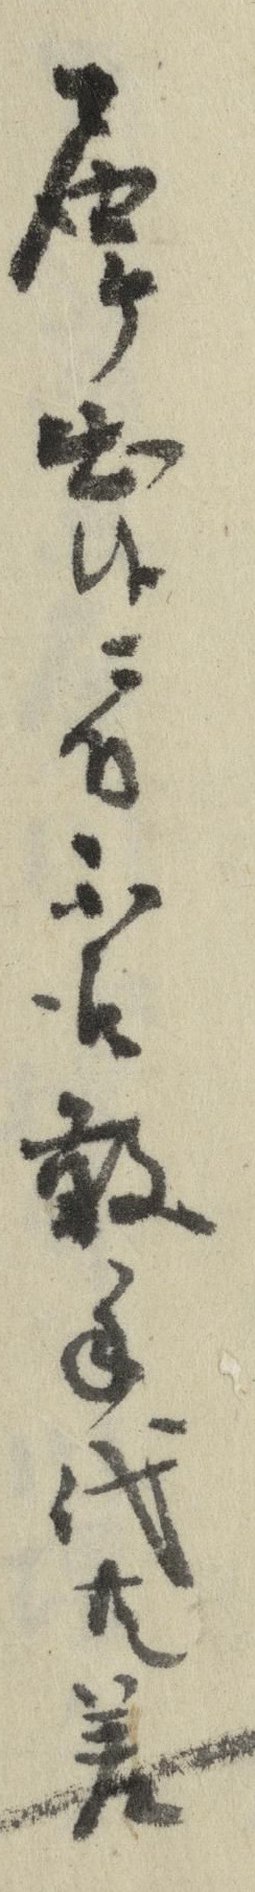届出候二付不取敢手代共差
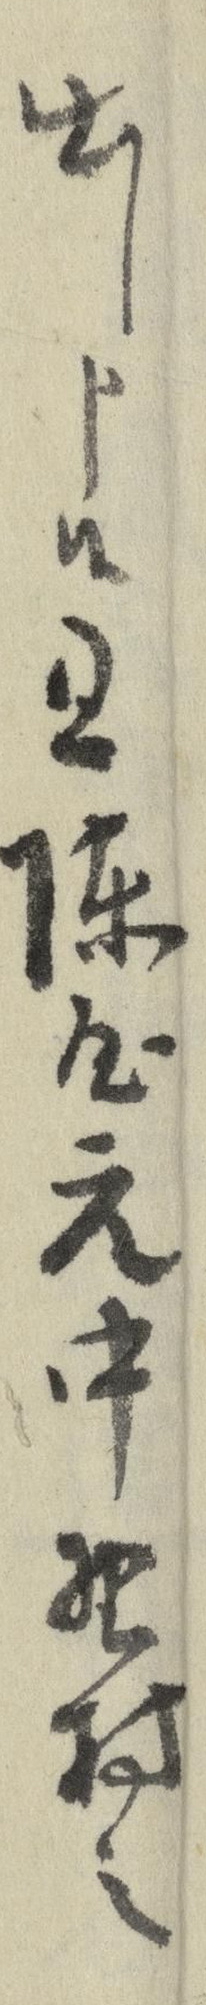出し申候且陣屋元中野村之
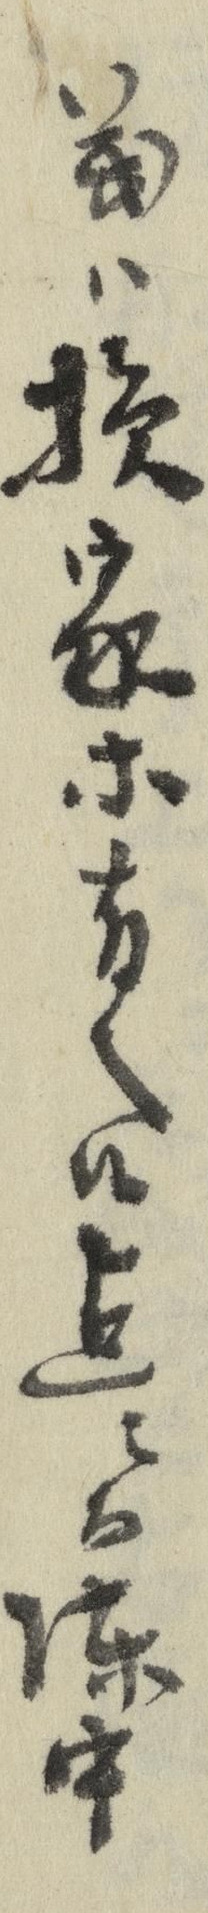義ハ損家等有之候迄二而陣中
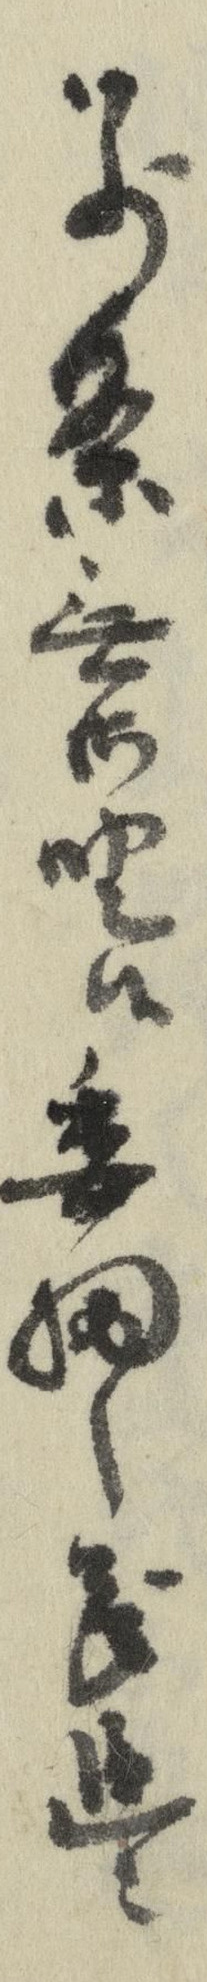別条無御坐候委細之義追々
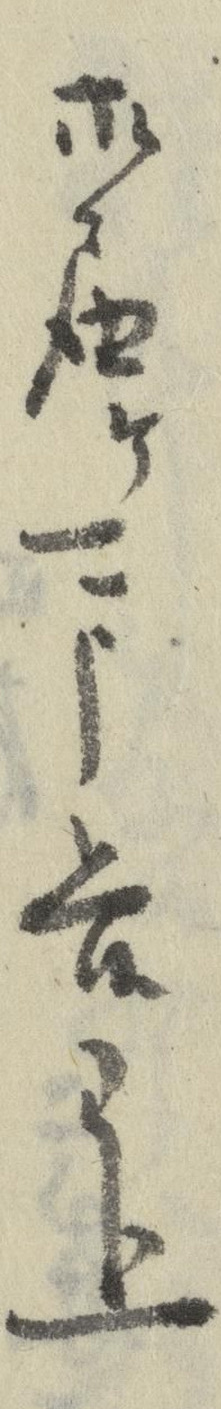御届可申上候以上
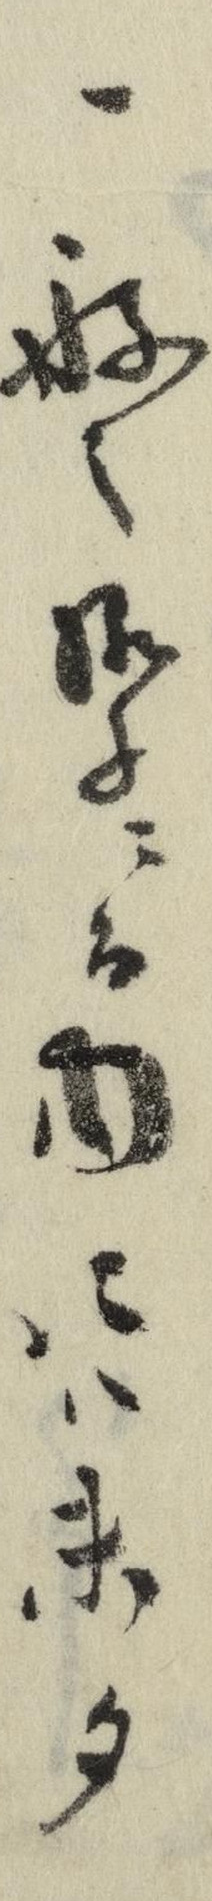一般之様子二而内二ハ未タ
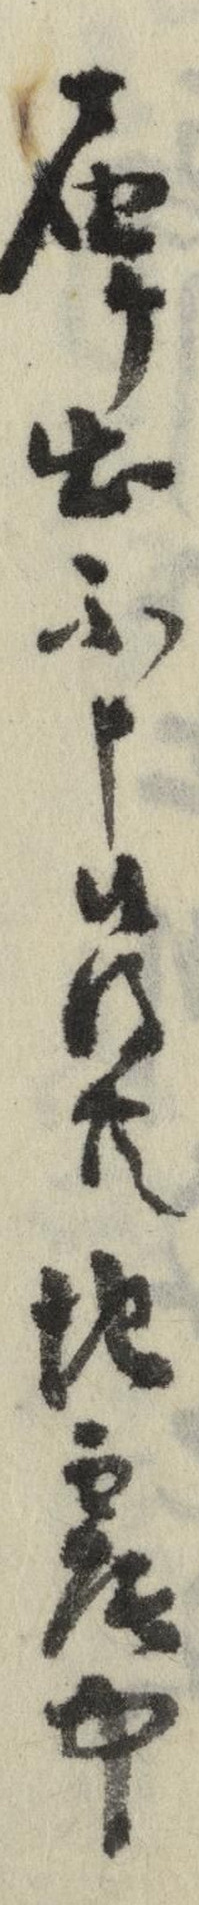届出不申候得共地震中
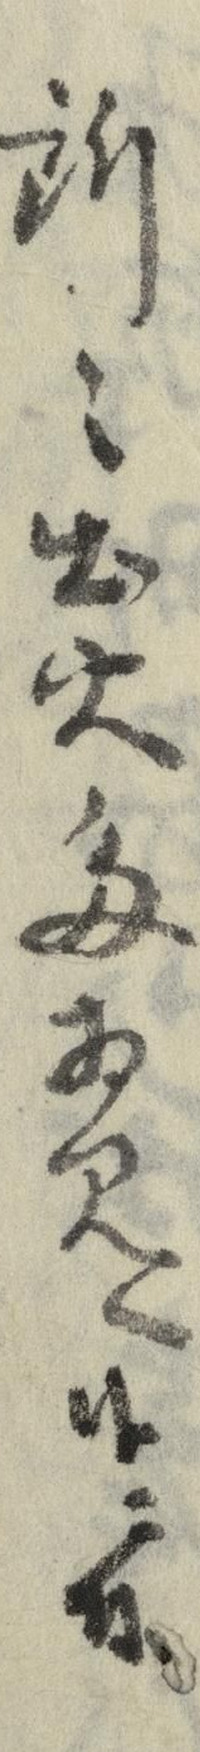所々出火多相見へ候二付
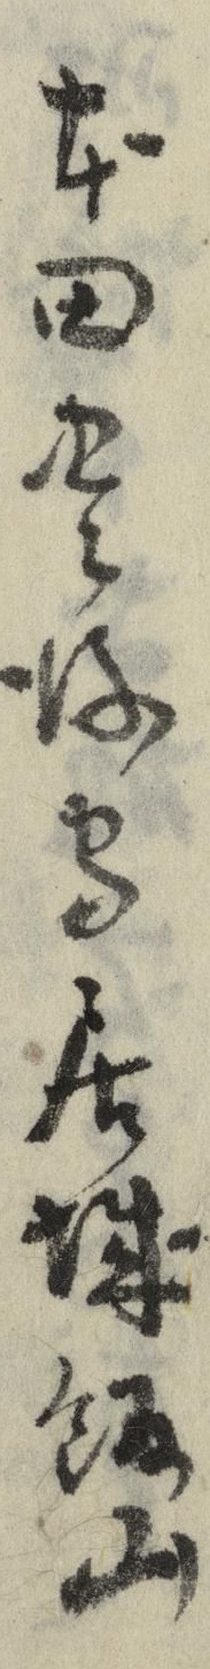本多豊後守居城飯山

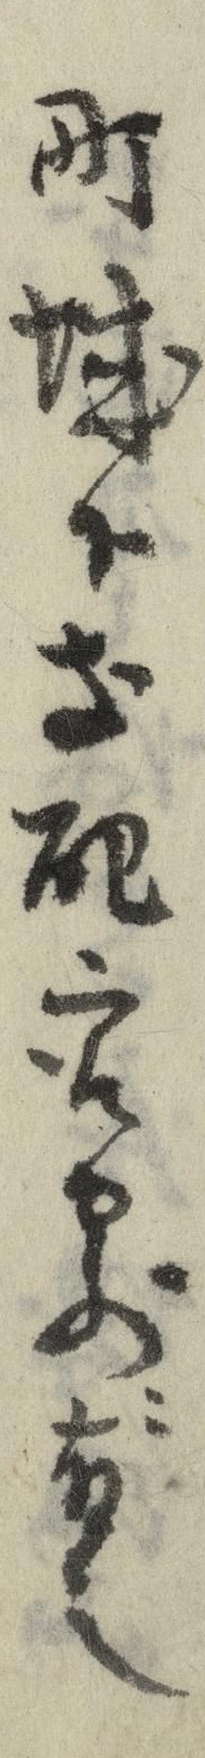町城下支配最寄ニ有之
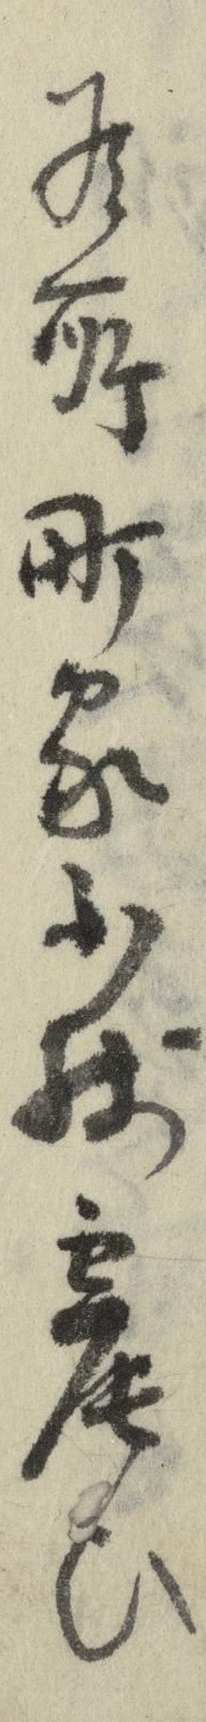右所町家不残震ひ
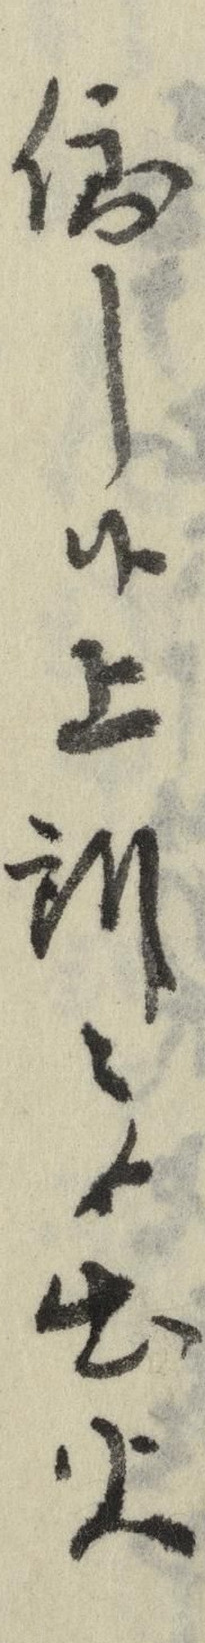倒し候上所々ゟ出火
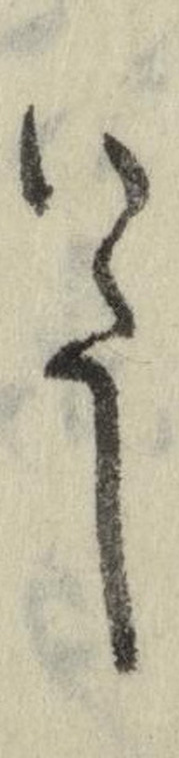いたし
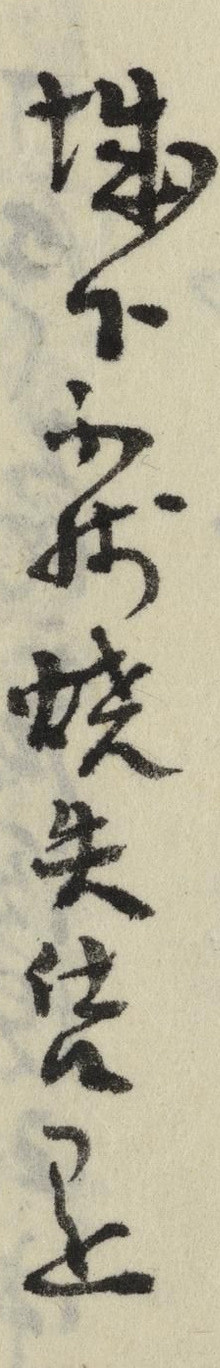城下不残消失仕候已上
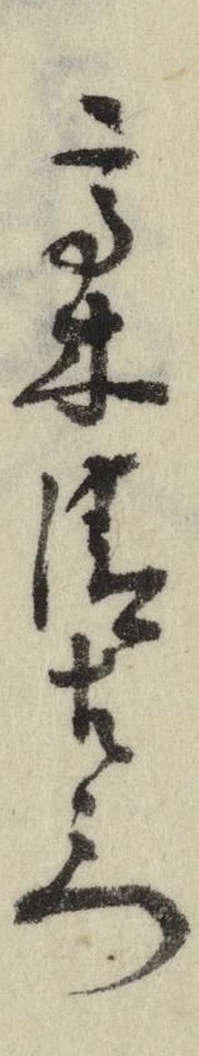高木清左衛門

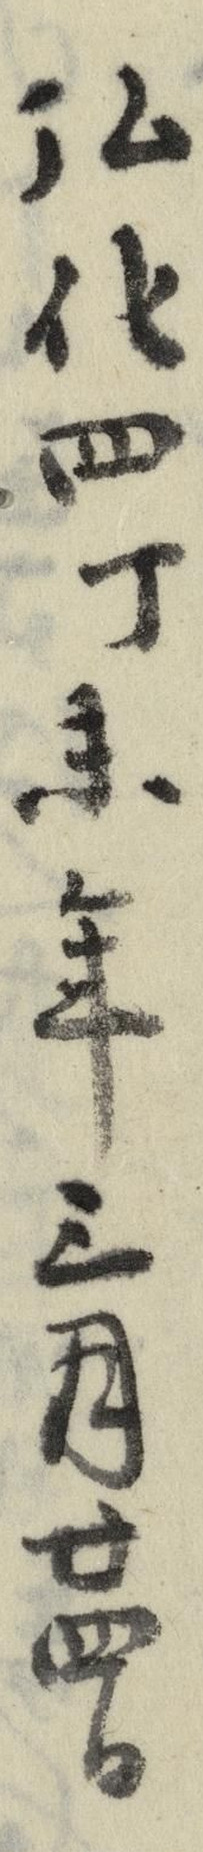弘化四丁未年三月廿四日
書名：信州大地震一件之冩　丁未弘化四年三月吉日
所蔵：東京大学地震研究所図書室 Earthquake Research Institute Library, The University of Tokyo, JAPAN
